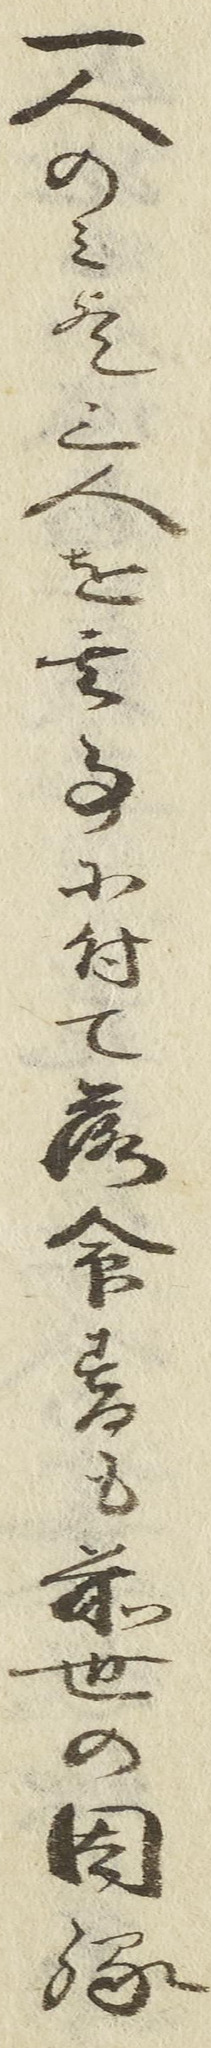一人のみか三人を其事に付て落命するも前世の因縁
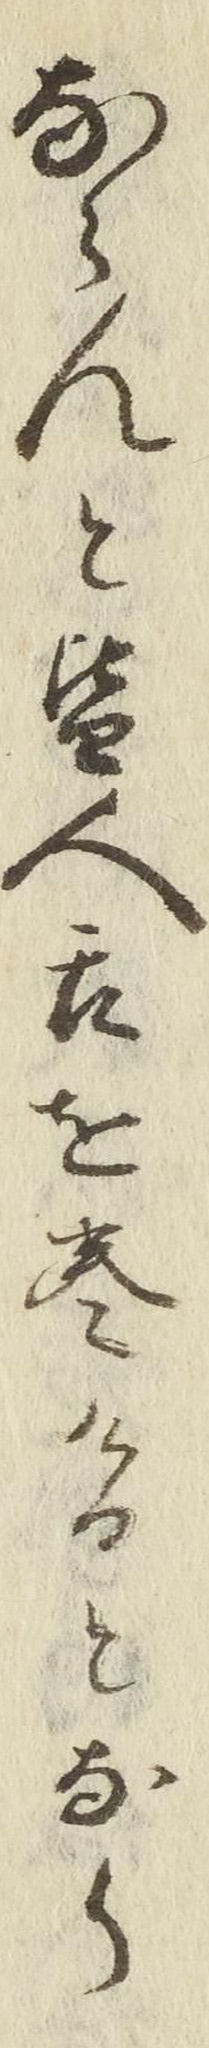ならんと皆人舌を巻けるとなり
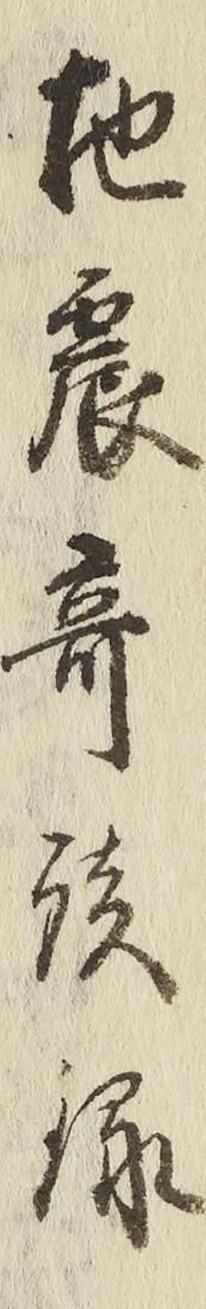地震奇談録
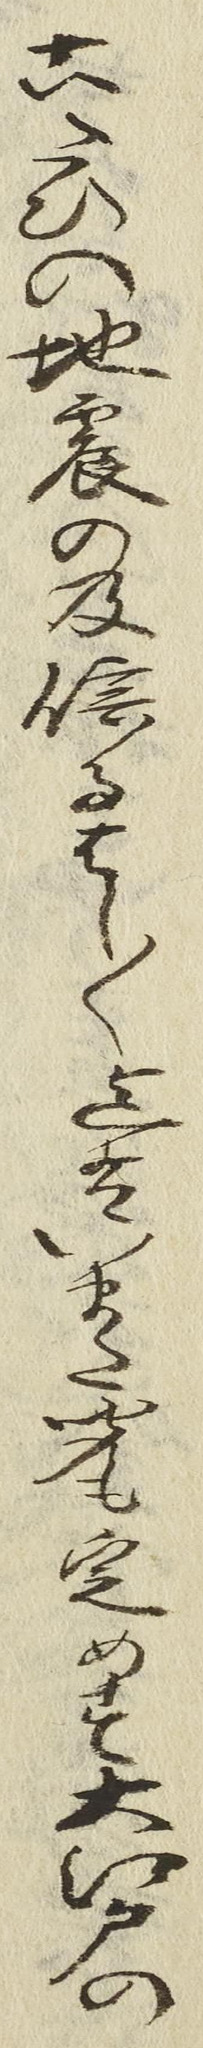こたひの地震の及信事はし〳〵迄はいまた聞も定めす大江戸の
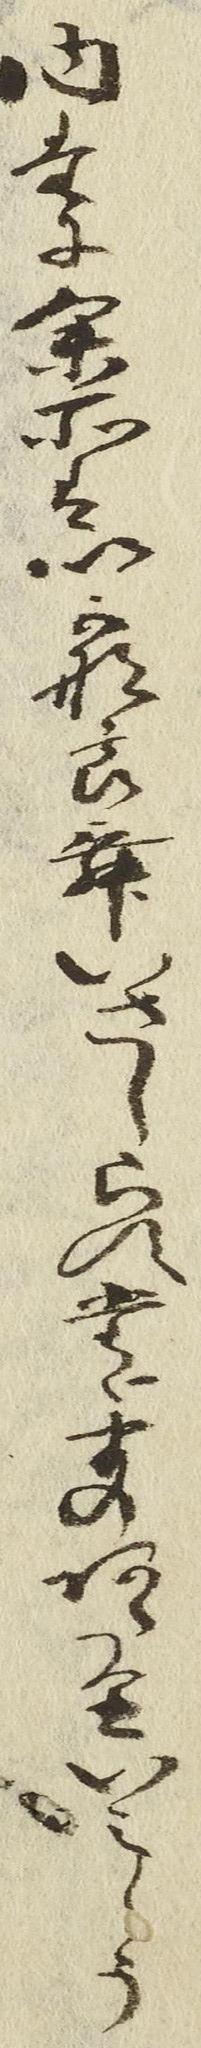内たに余所はいかならむいさしらすたゞまのあたりいみしう
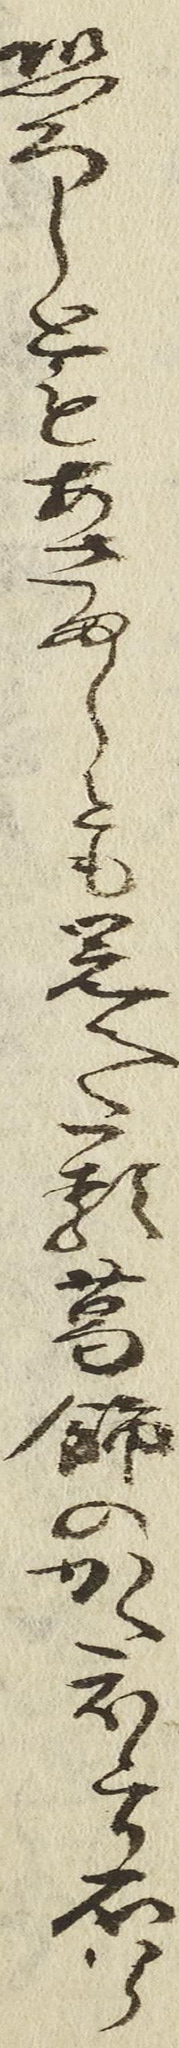恐ろしともあさましとも覚へたる葛飾のかたほとり石はら
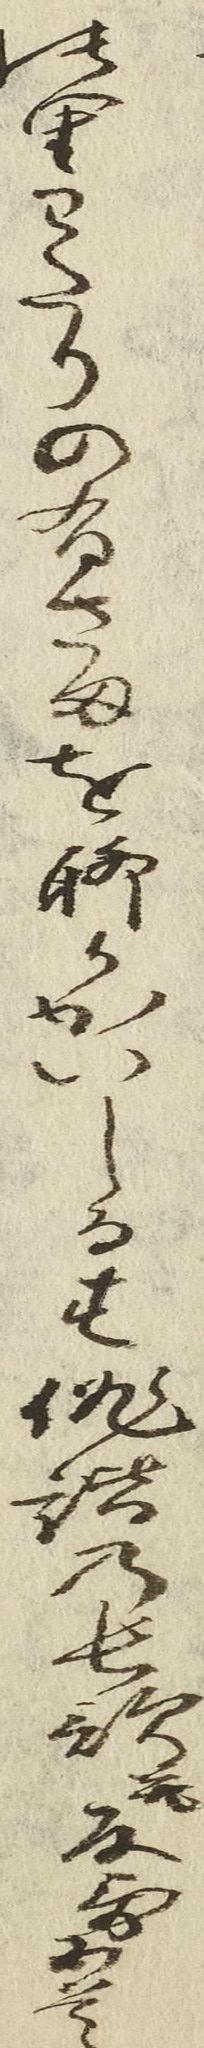の里わたりの有さまを聊かかいしるす俳諧の長歌幷反歌五首
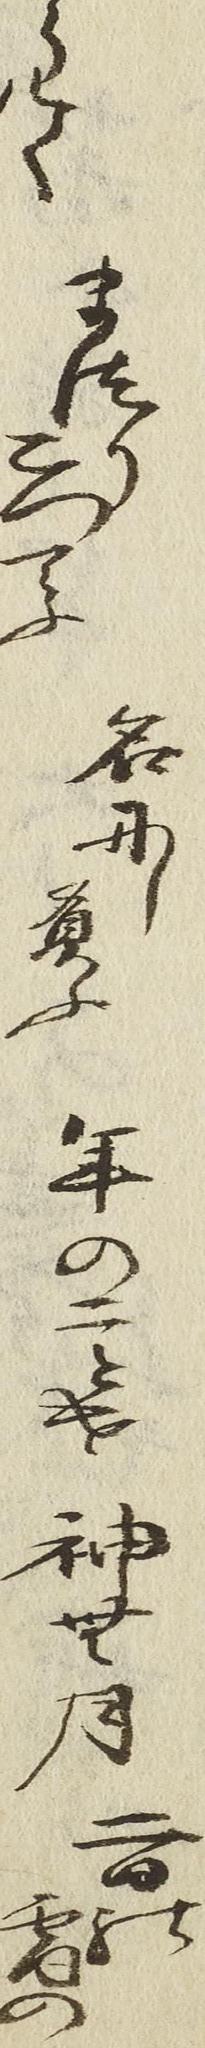やすらけくまつりこつてふ名にし負ふ年の二とせ神無月二日の宵の

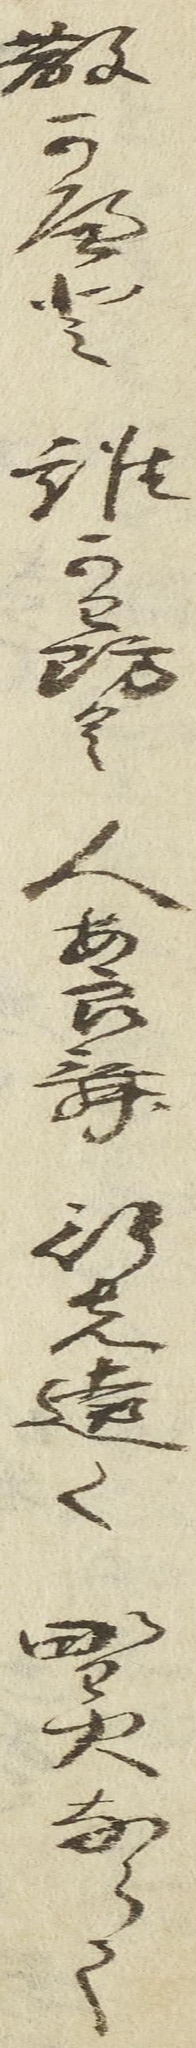散かへと誰かわ防く人あらむ行先遠く野火ならて
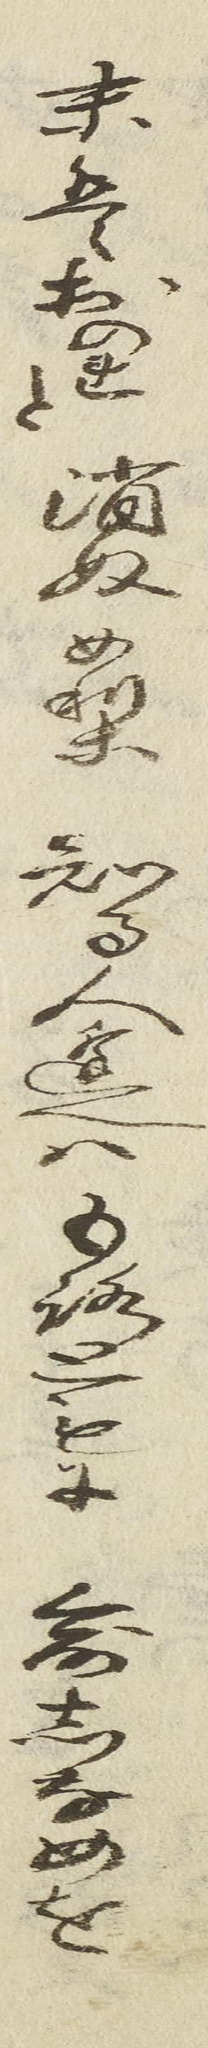末はおのれと消ぬめり知る人逢ハもろともに命しなめを
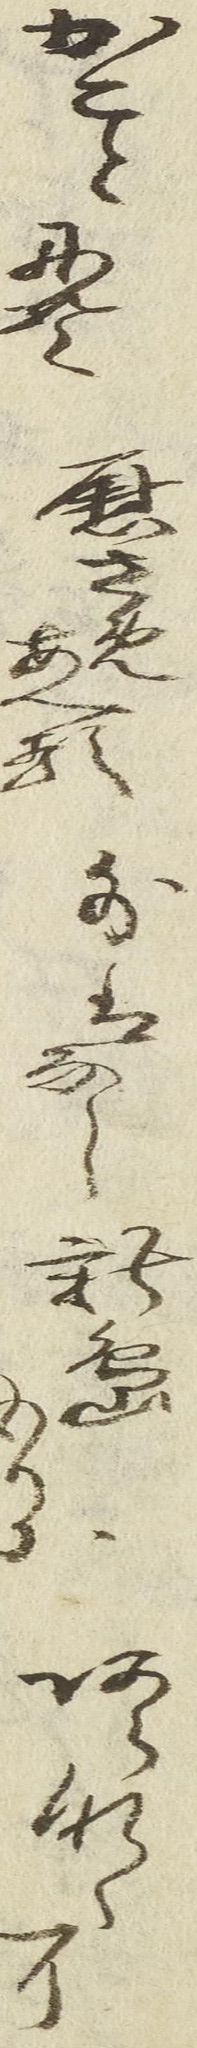かことにそ慰さめあへる外はなし新島もりにあらなくに
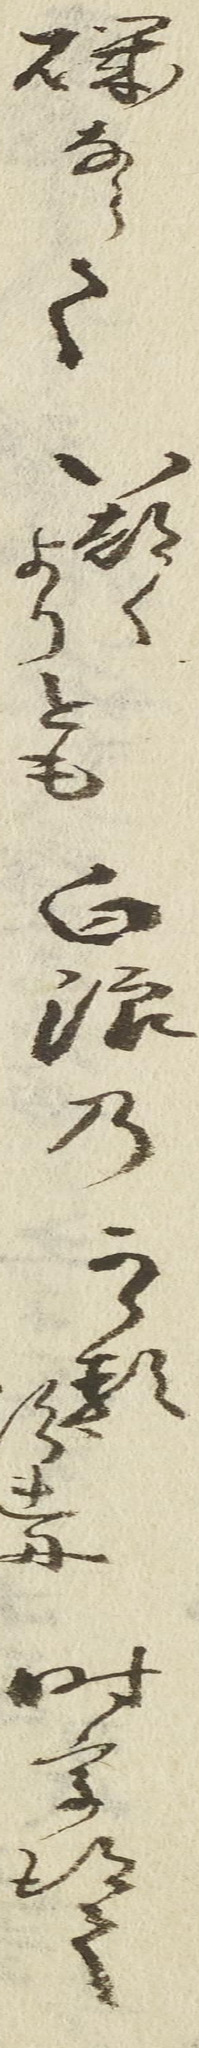磯ならていつくよりとも白浪のかゝる紛れに時を得て
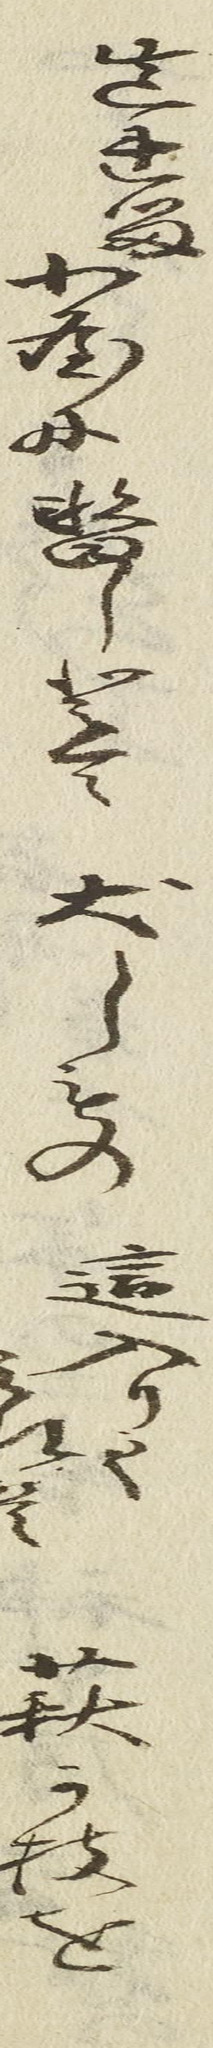造れる小屋に暫しとて犬しもの這入りてみれは萩か枝を
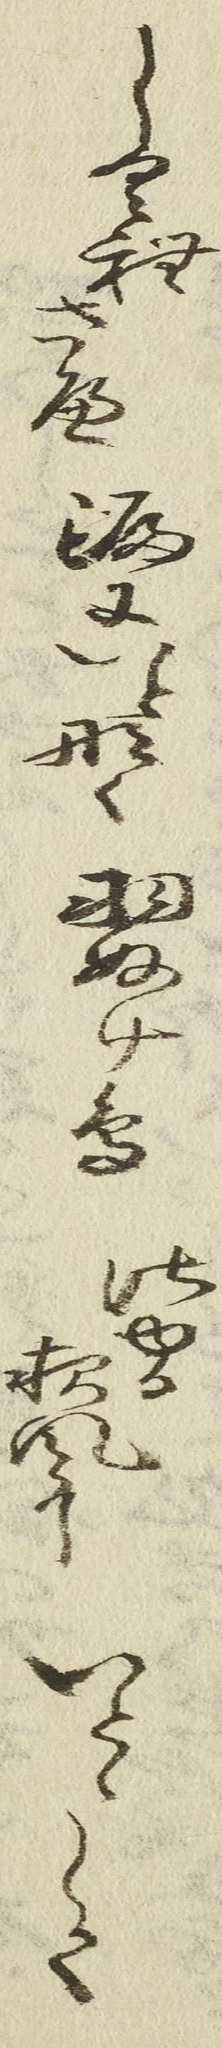しくれさへ涙？にいとなく羽ぬけ鳥さゆる夜風にいとゝして
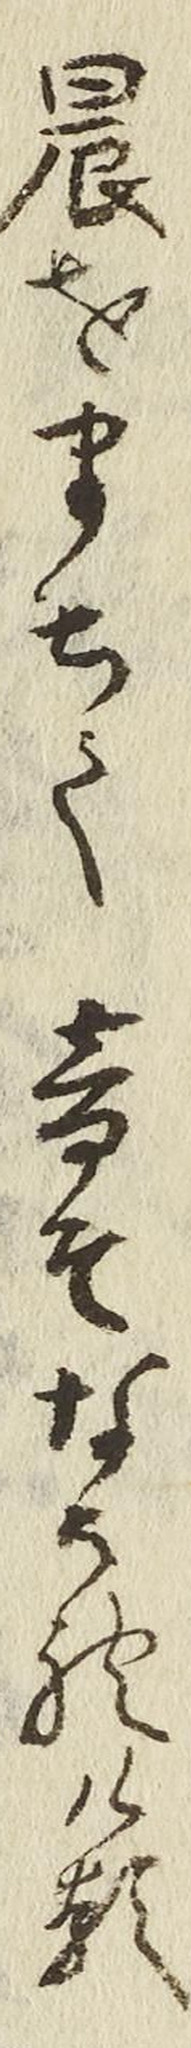晨をまちて音そなかれける
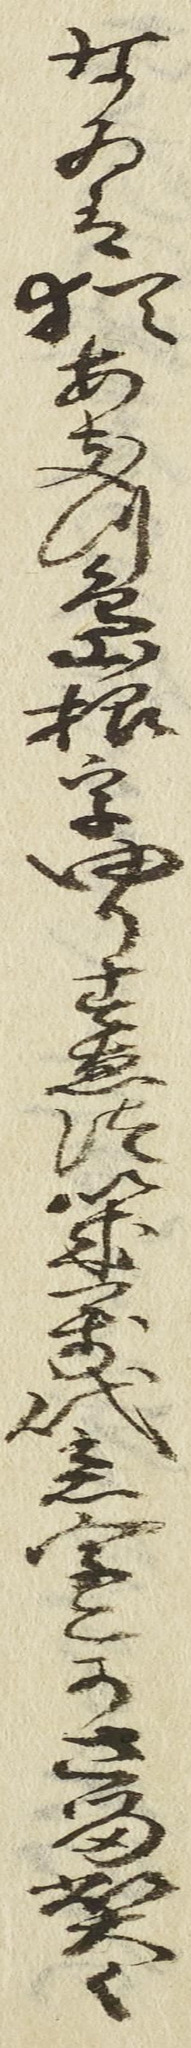なゐは猶あきつ島根をゆりすゑつ幾万代もうこかさるへく
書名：安政二年震災記事　完
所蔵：東京大学地震研究所図書室 Earthquake Research Institute Library, The University of Tokyo, JAPAN
